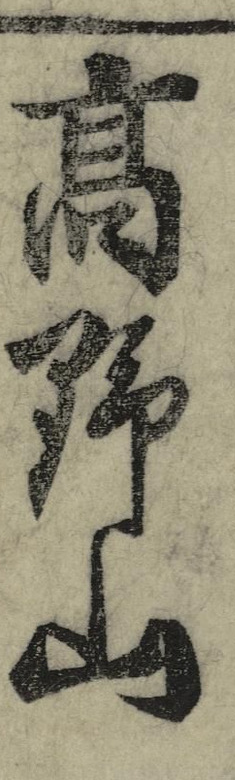高野山
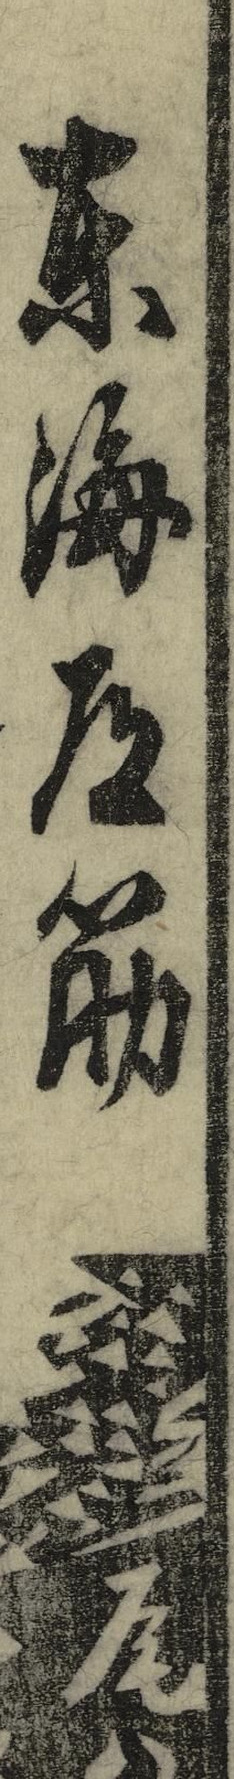東海道筋
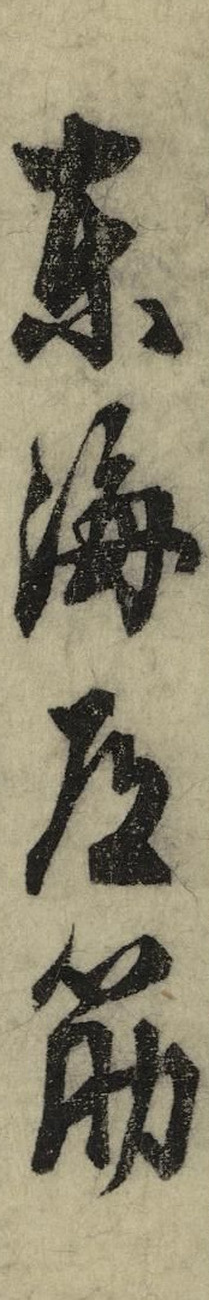東海道筋
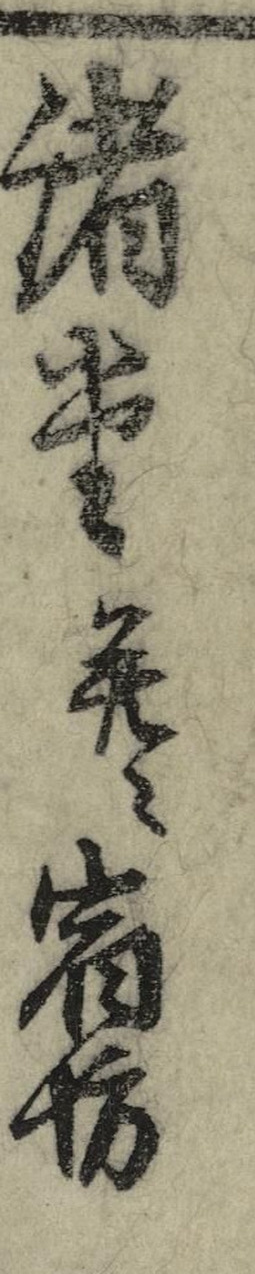諸堂并ニ宿坊
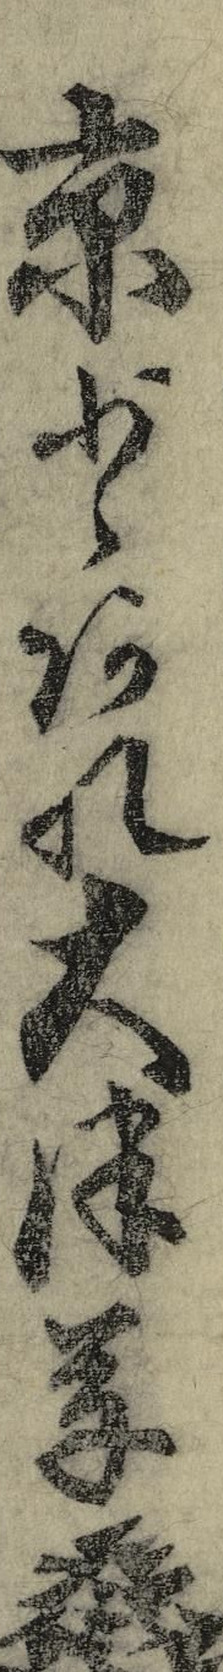京少々あれ大津草
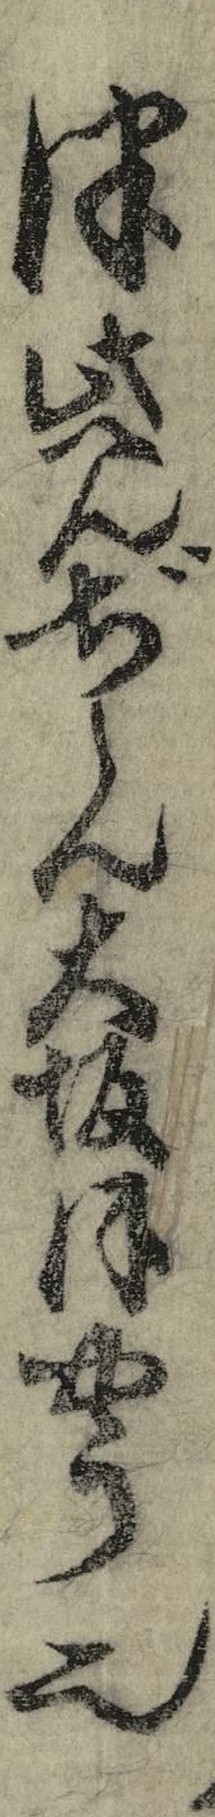津此へんぢしん大坂つやう也
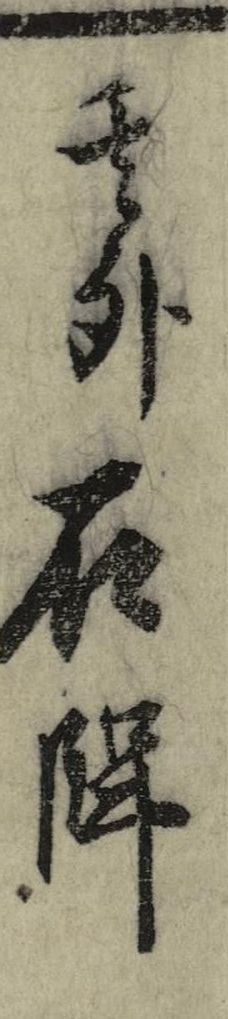其外石牌
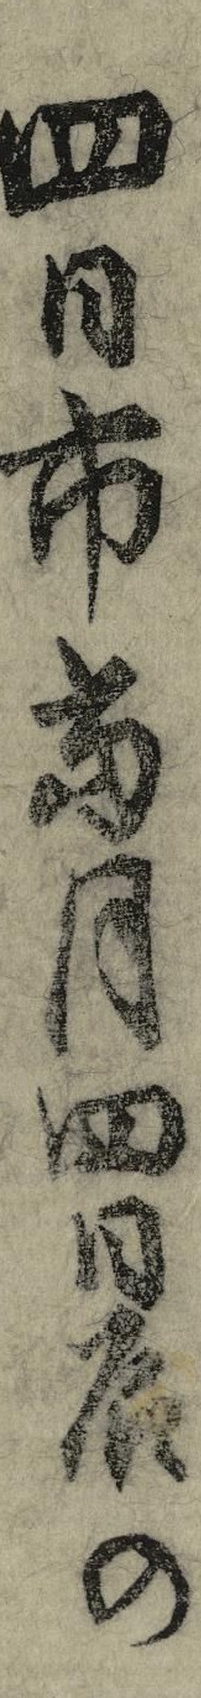四日市当月四日辰の
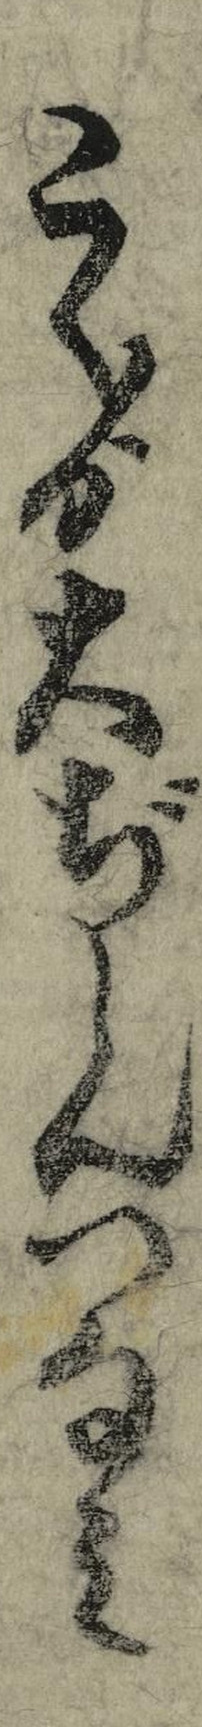こくゟ大ぢしんつなミ
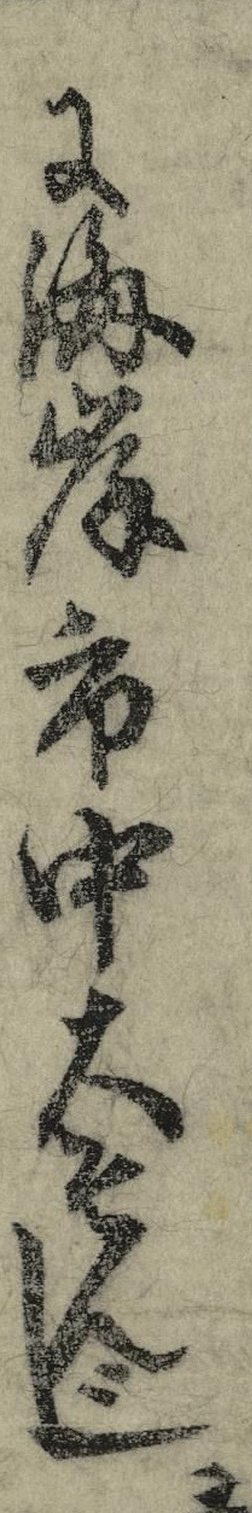に海岸市中大そんじ
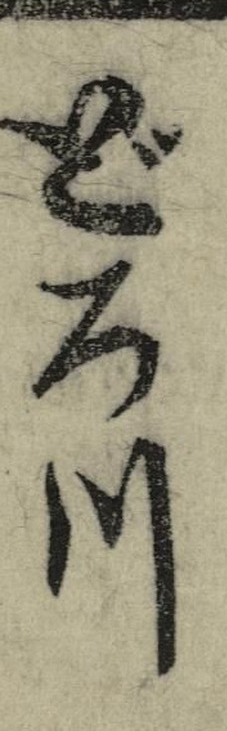どろ川
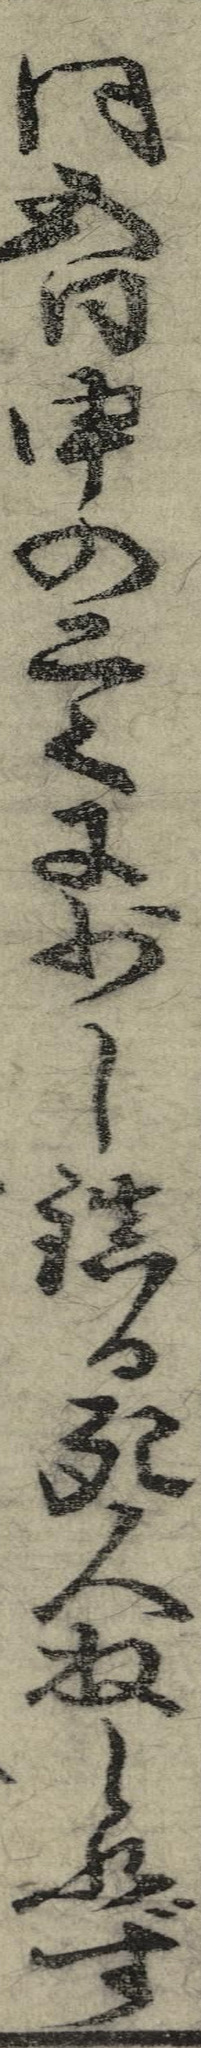同五日申のこくに少し鎮る死人数しれず
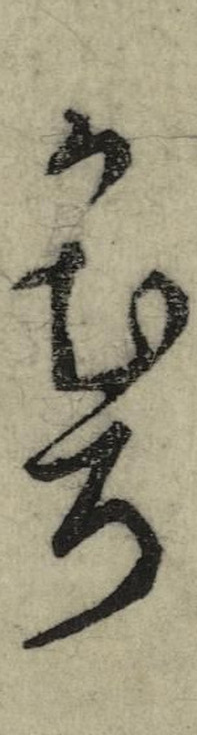かむろ
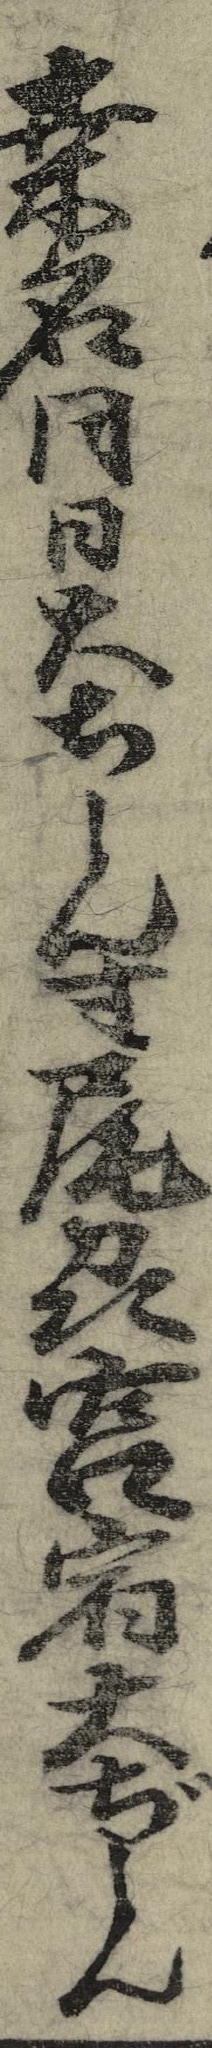桑名同日大地震す尾州宮宿大ぢしん
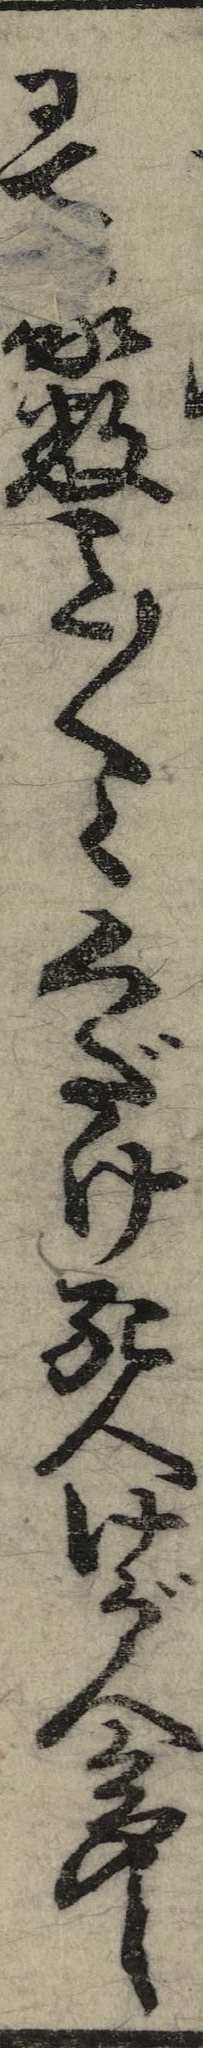にて家数こと〴〵くくだけ死人けが人多し
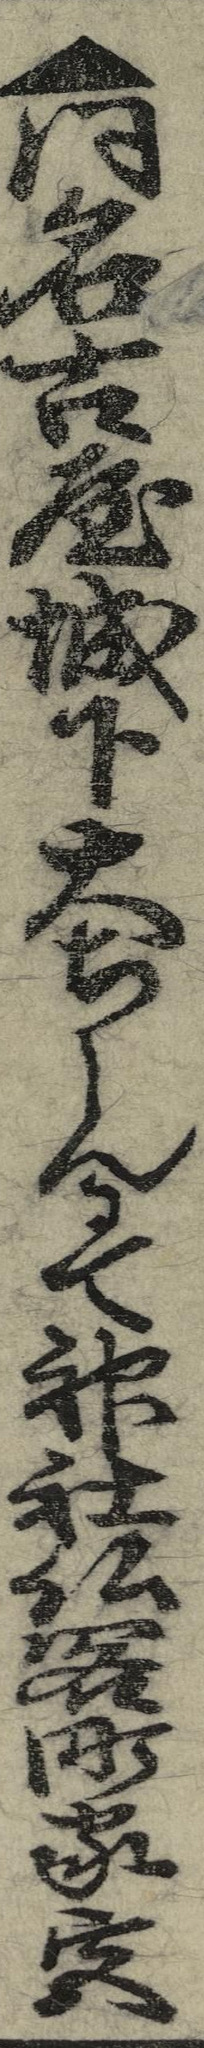▲同名古屋城下大ちしんにて神社仏閣町家宮
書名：諸國大地震つなみ混乱記　嘉永七寅十一月四日五日両日之次第三編
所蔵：東京大学地震研究所図書室 Earthquake Research Institute Library, The University of Tokyo, JAPAN
